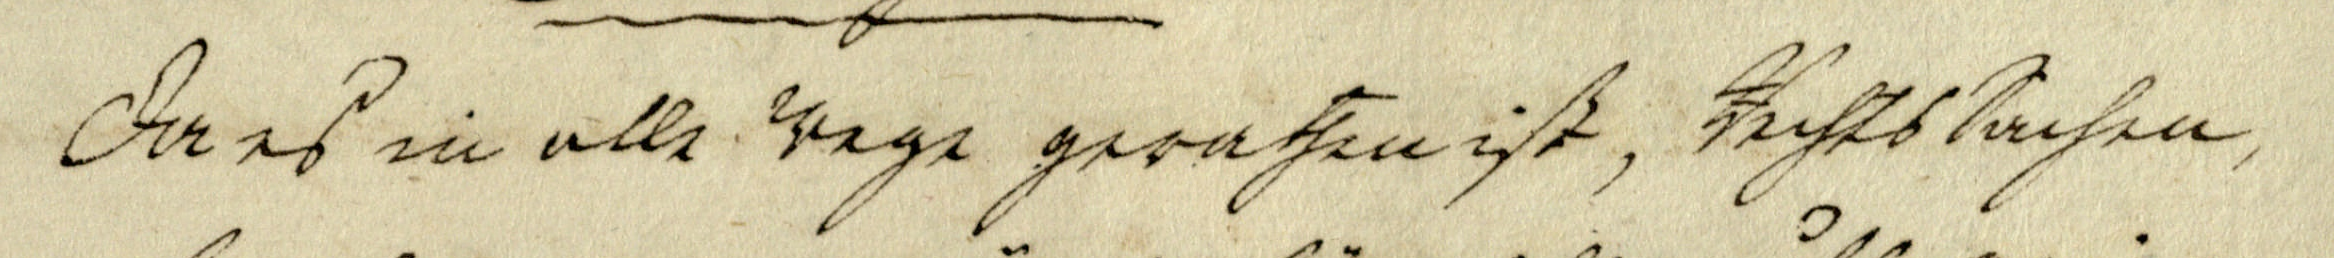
Da es in alle Wege gerathen ist, Rechts Sachen,
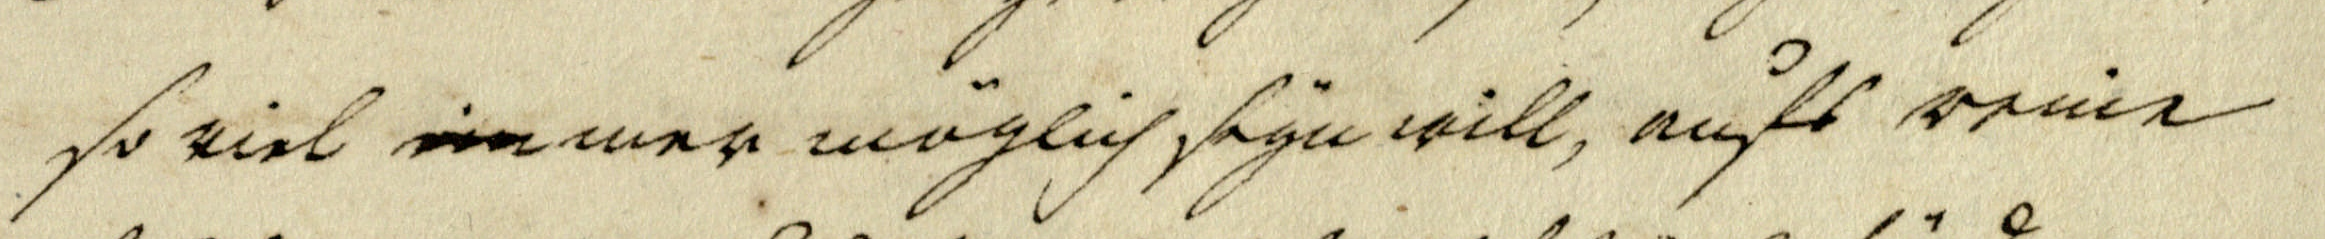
so viel immer möglich seyn will, aufs reine
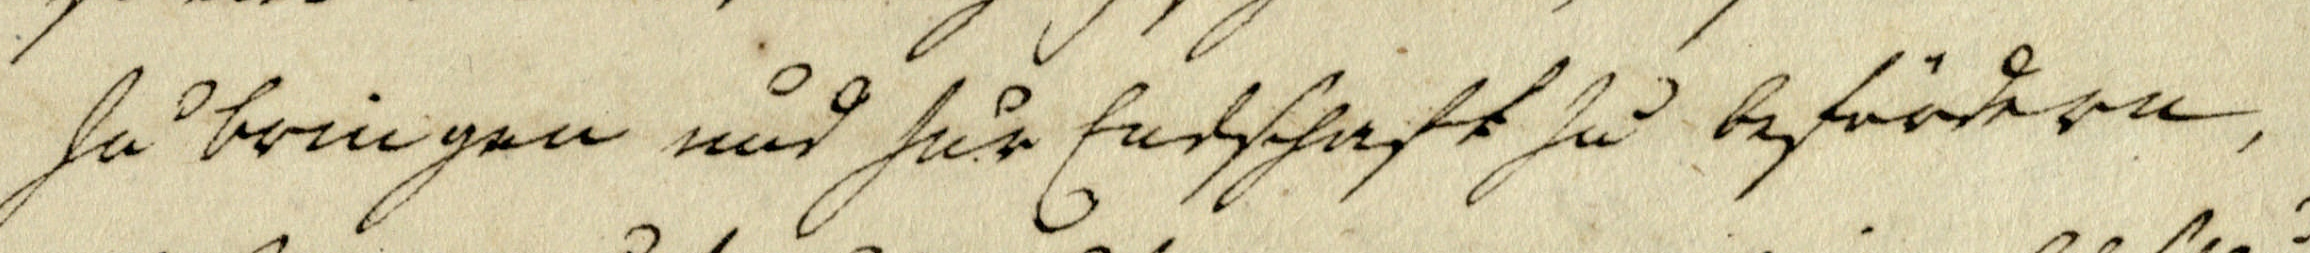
zu bringen und zur Endschaft zu befördern,
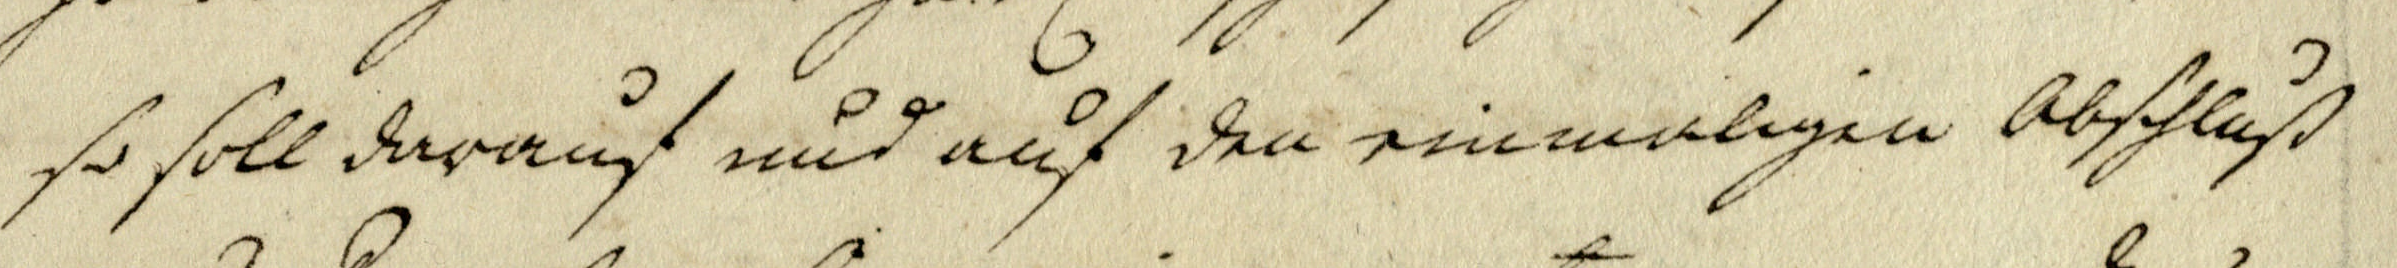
so soll darauf und auf den einmaligen Abschluß
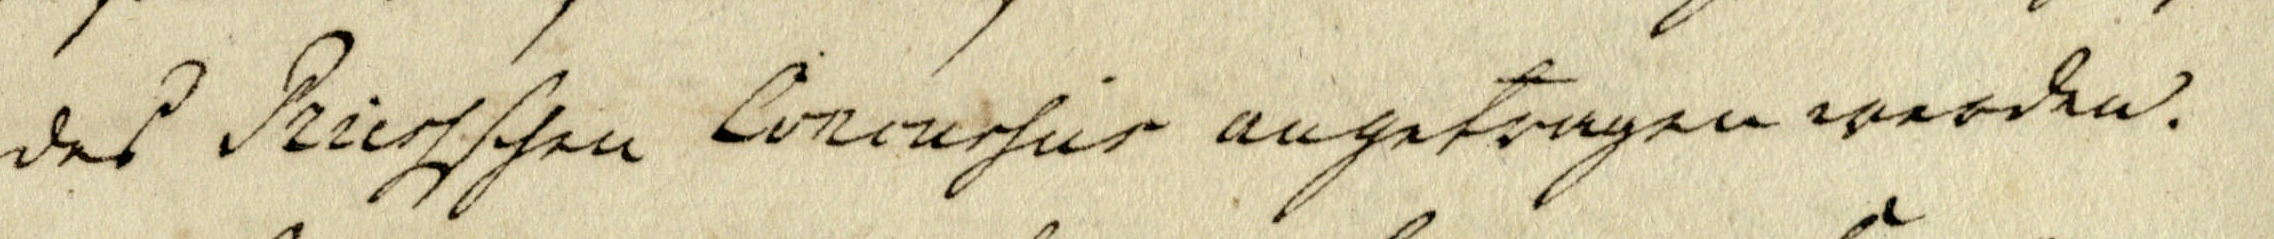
des Prießschen Concursus angetragen werden.
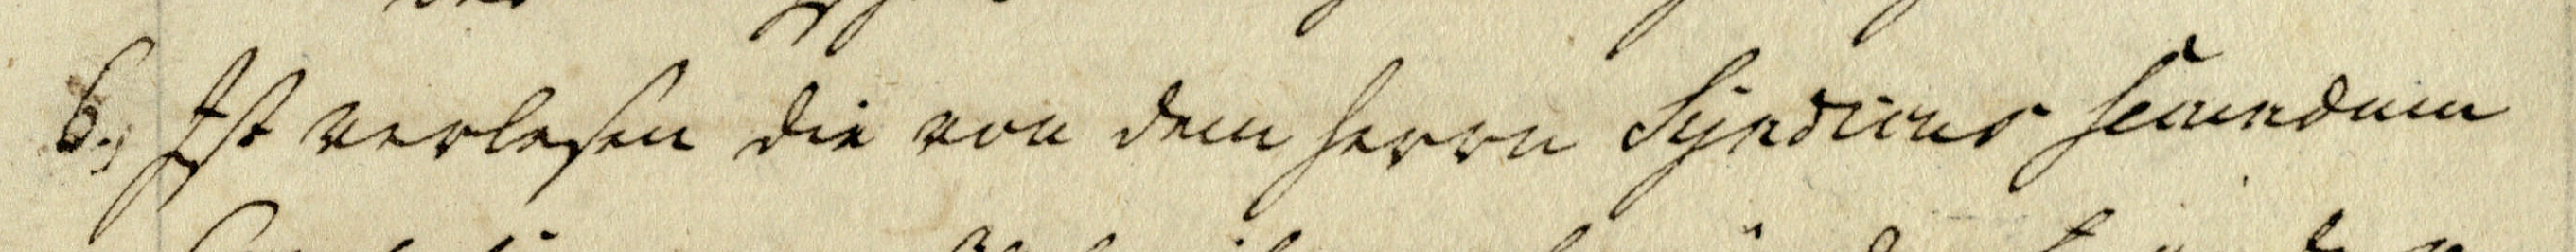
6., Ist verlesen die von dem Herrn Sÿndicus secundum
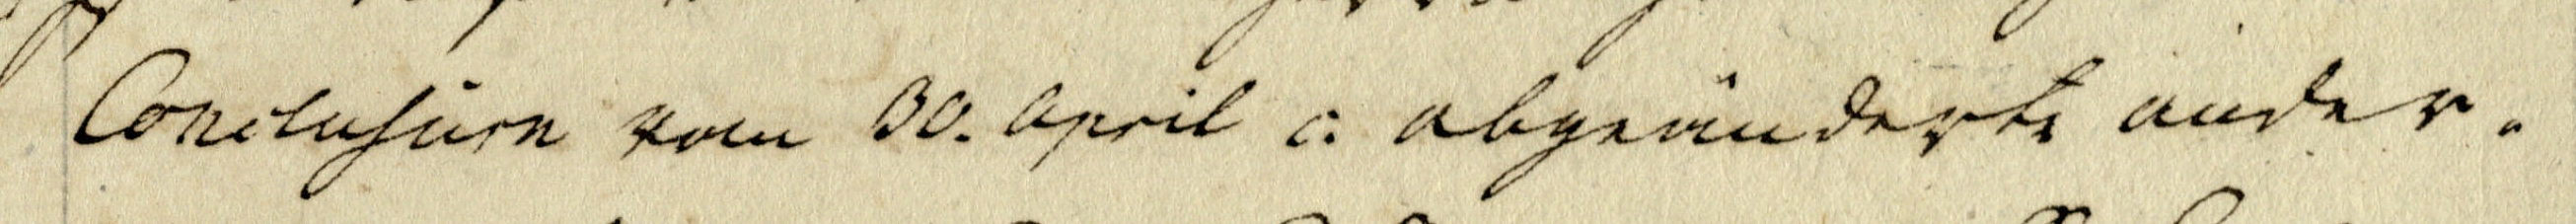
Conclusum vom 30. April c. abgeänderte ander¬
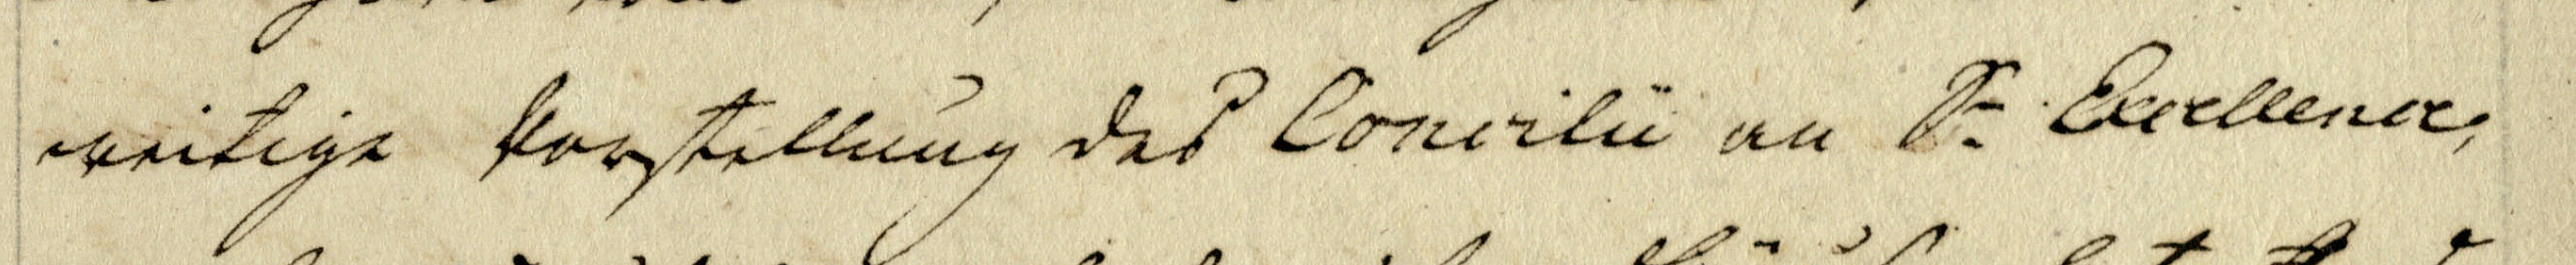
weitige Vorstellung des Concilii an Sr. Excellence,
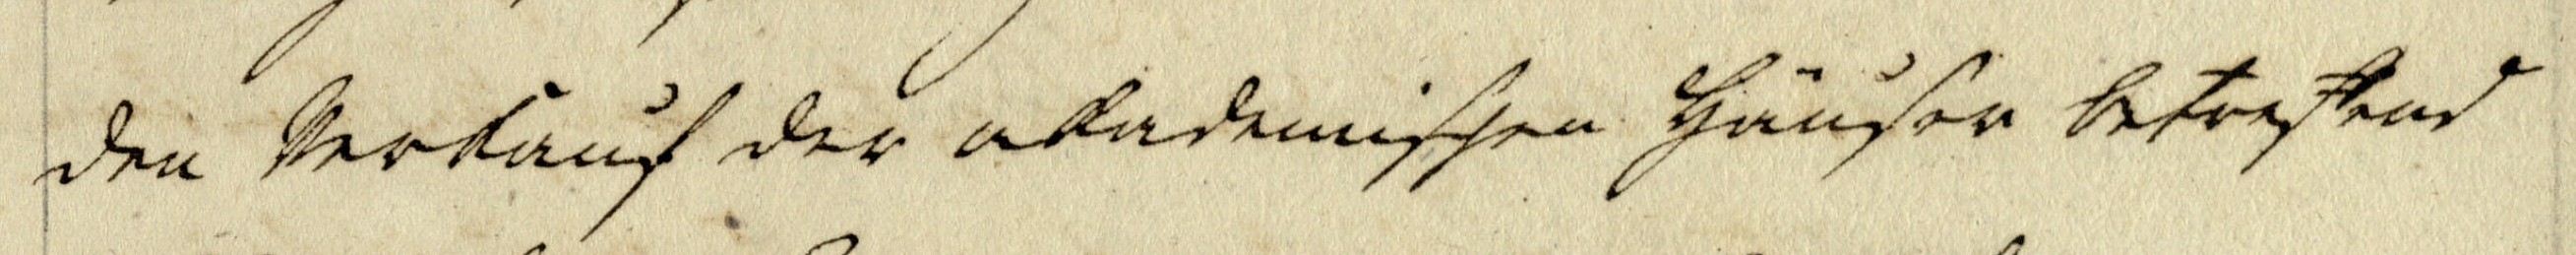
den Verkauf der akademischen Häuser betreffend
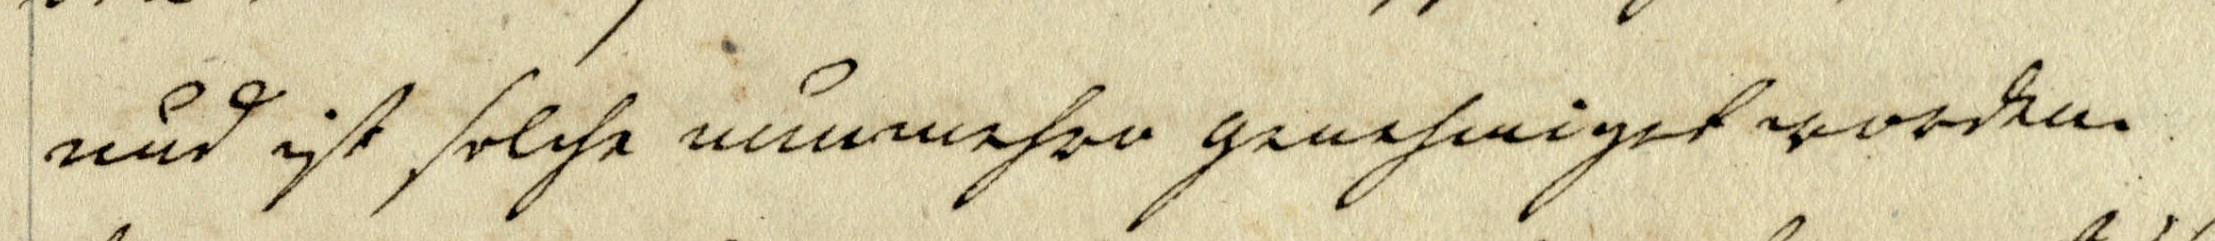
und ist solche nunmehro genehmiget worden.
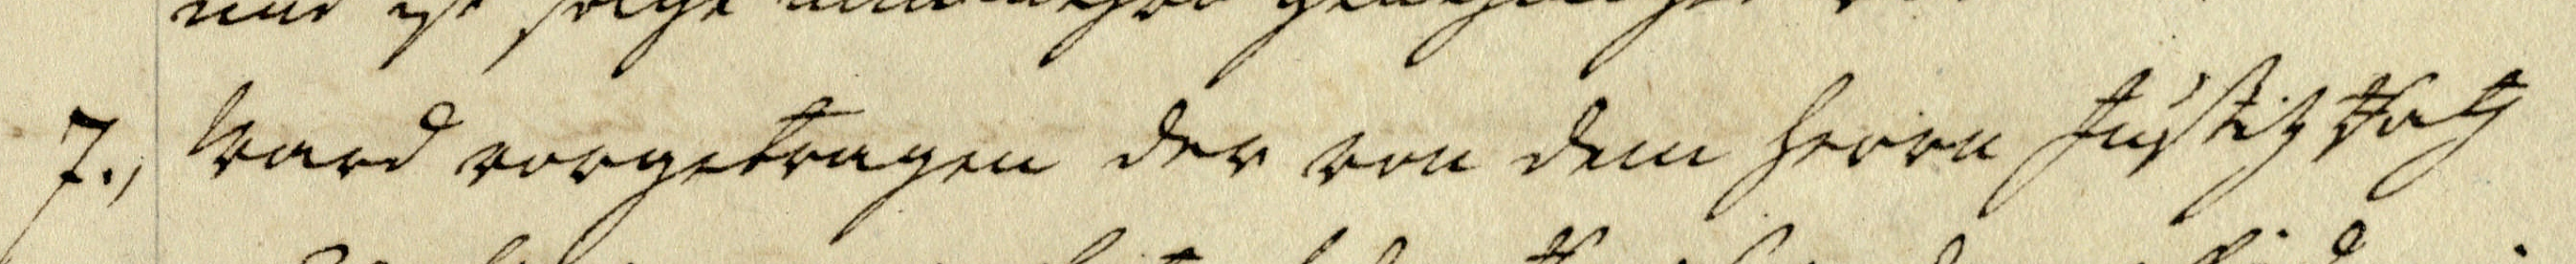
7., Ward vorgetragen der von dem Herrn Justiz Rath
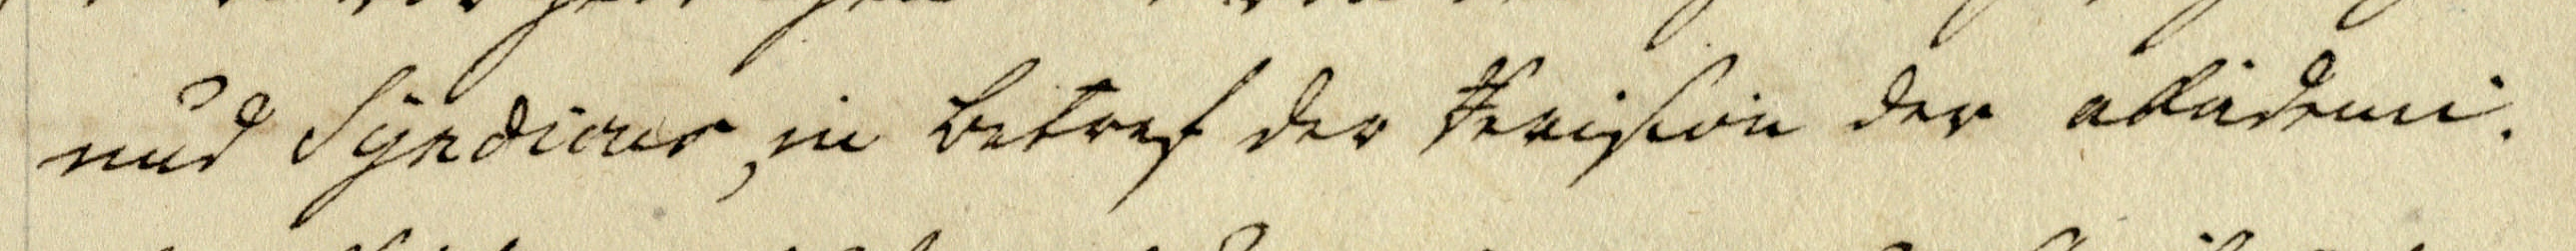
und Sÿndicus, in Betref der Revision der akademi¬
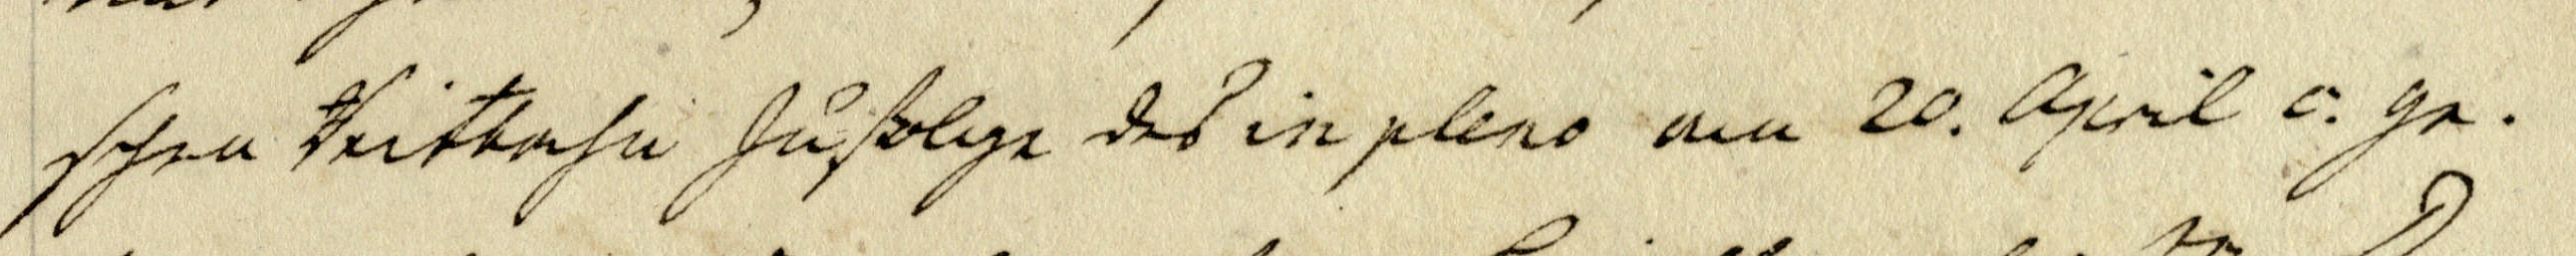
schen Reitbahn zufolge des in pleno am 20. April c. ge¬
